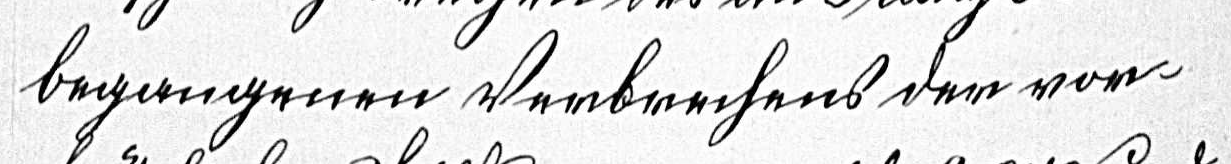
begangenen Verbrechens der vor¬
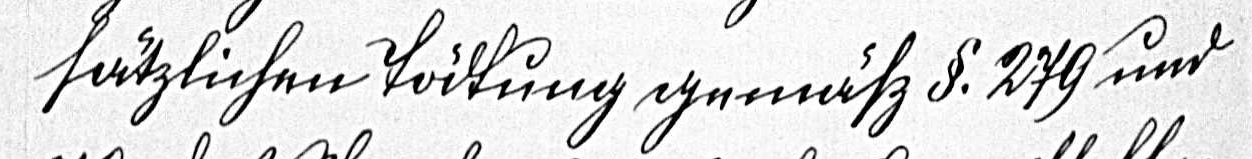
sätzlichen Tödtung gemäß §279 und
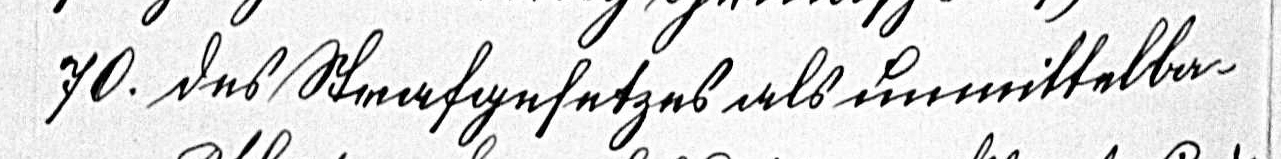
70 des Strafgesetzes als unmittelba¬
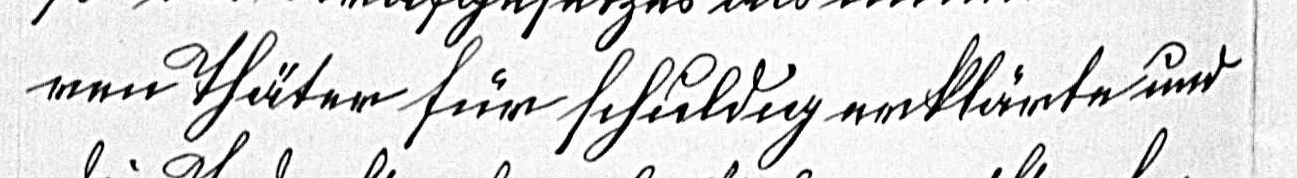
ren Thäter für schuldig erklärte und
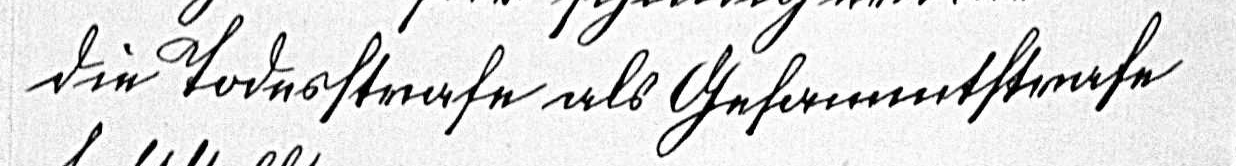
die Todesstrafe als Gesammtstrafe
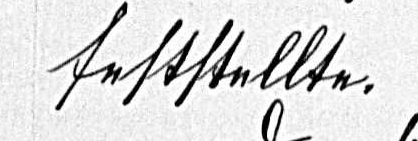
feststellte.
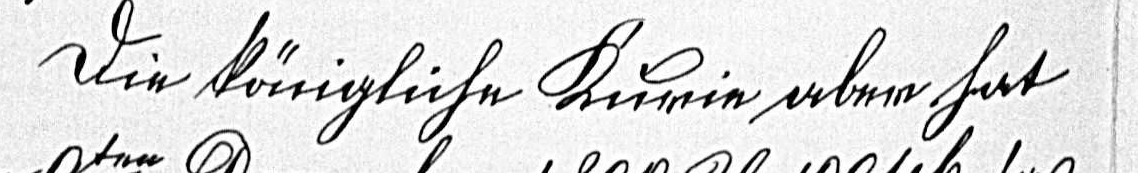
Die königliche Kurie aber hat
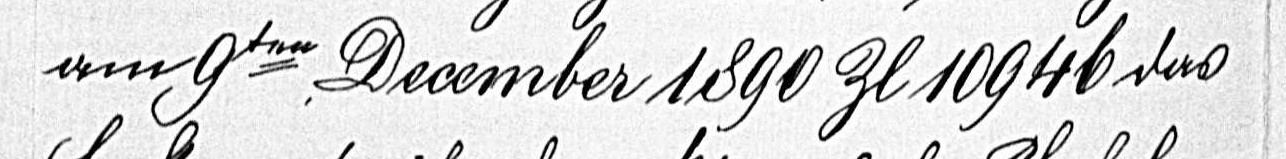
am 9ten December 1890 Zl 10946 das
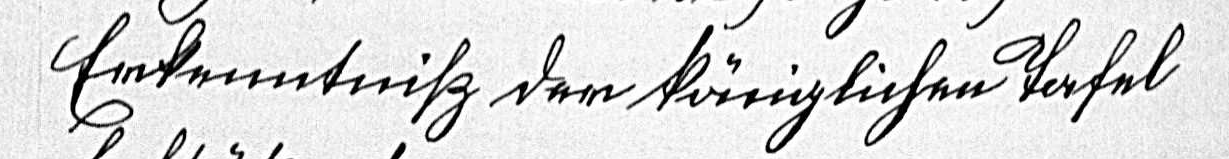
Erkentnniß der königlichen Tafel
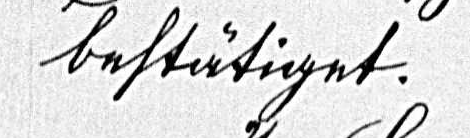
bestätiget.
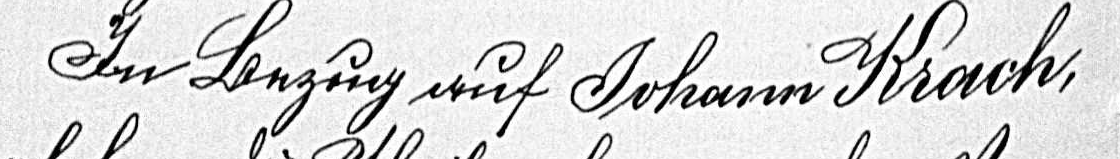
In Bezug auf Johann Krach,
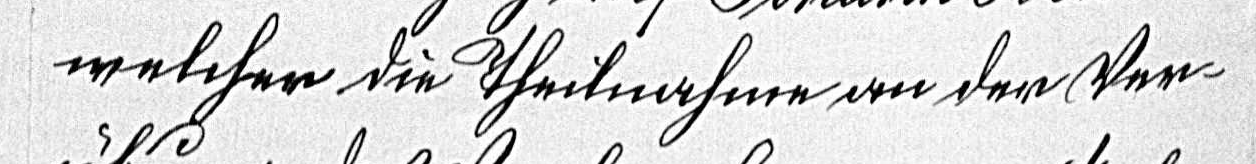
welcher die Theilnahme an der Ver¬
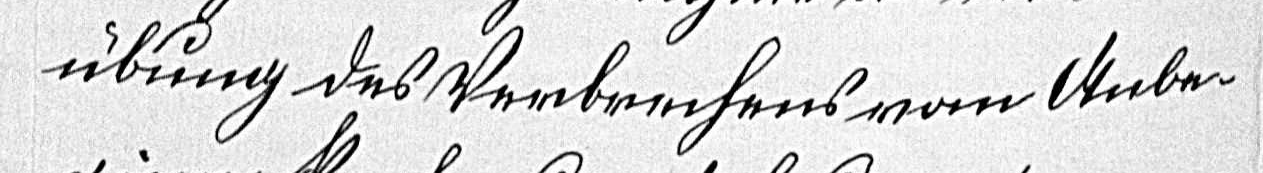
übung des Verbrechens von Anbe¬
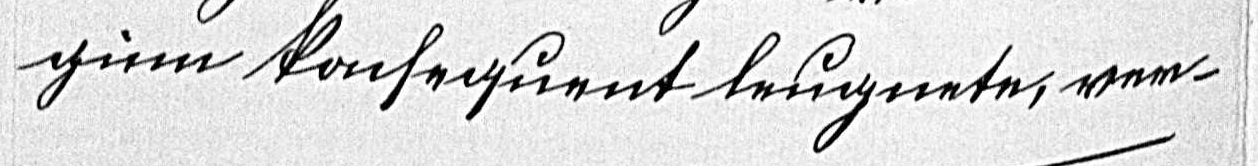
ginn konsequent leugnete, ver¬
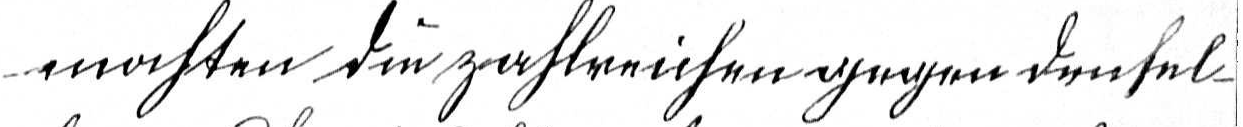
mochten die zahlreichen gegen densel¬
